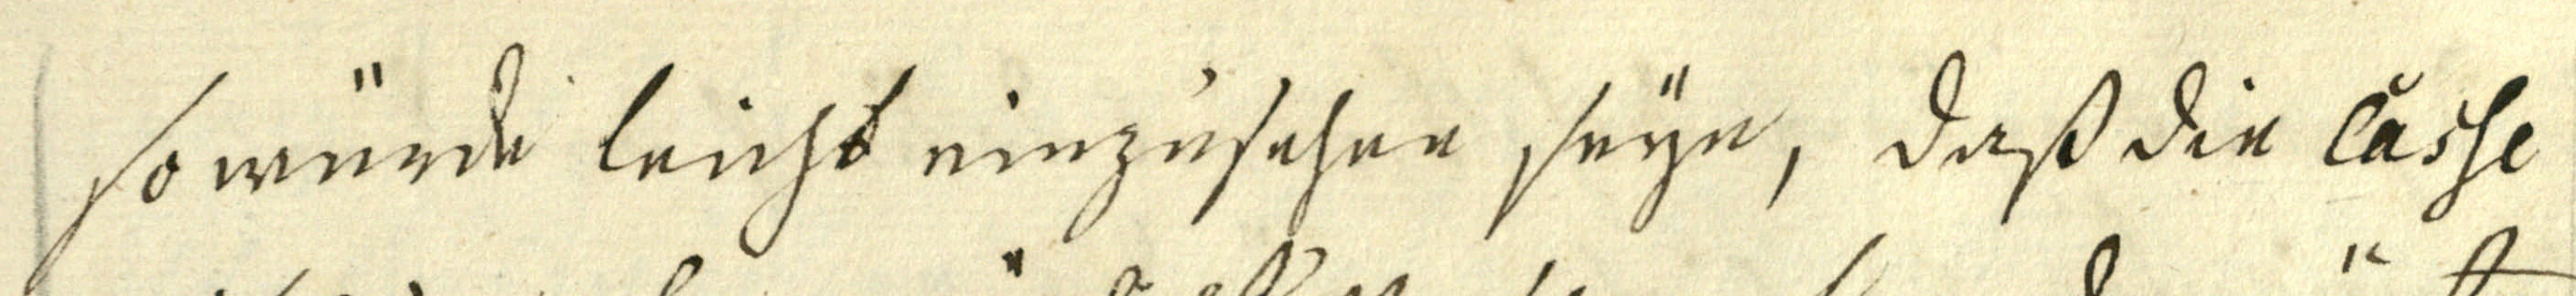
so würde leicht einzusehen seÿn, daß die Casse
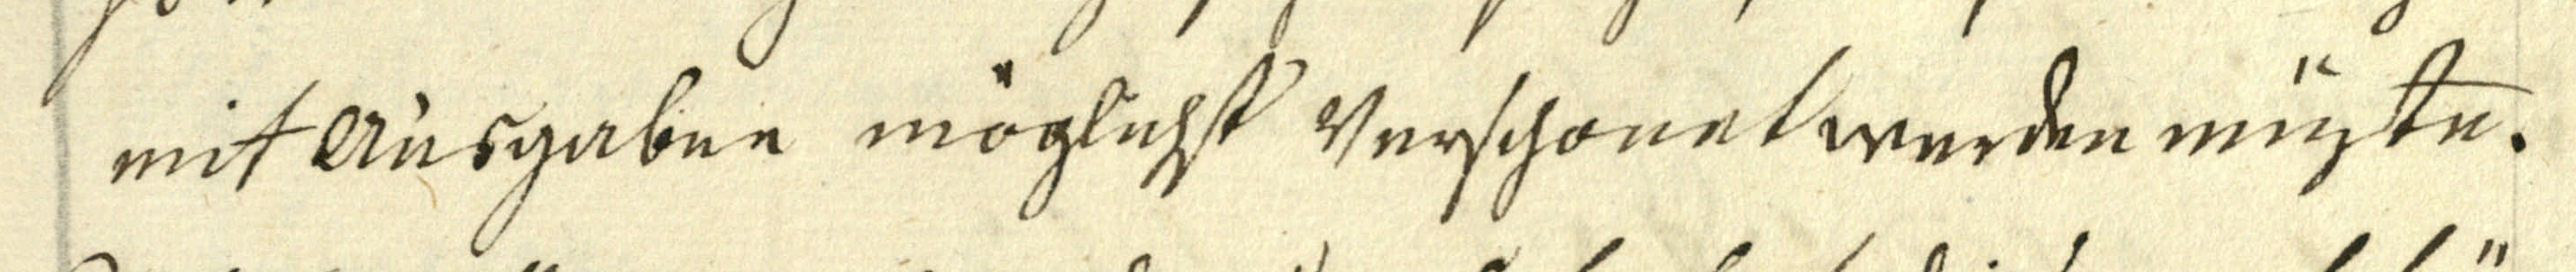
mit Ausgaben möglichst verschonet werden müste.
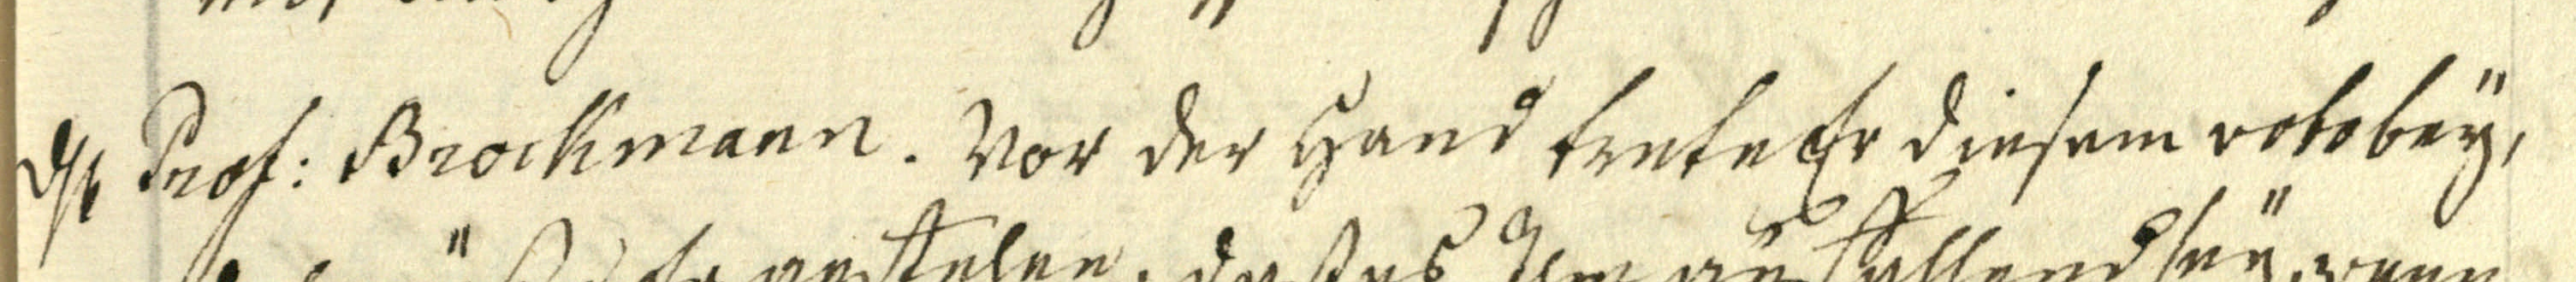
dh Prof. Brockmann. Vor der Hand trete Er diesem voto beÿ,
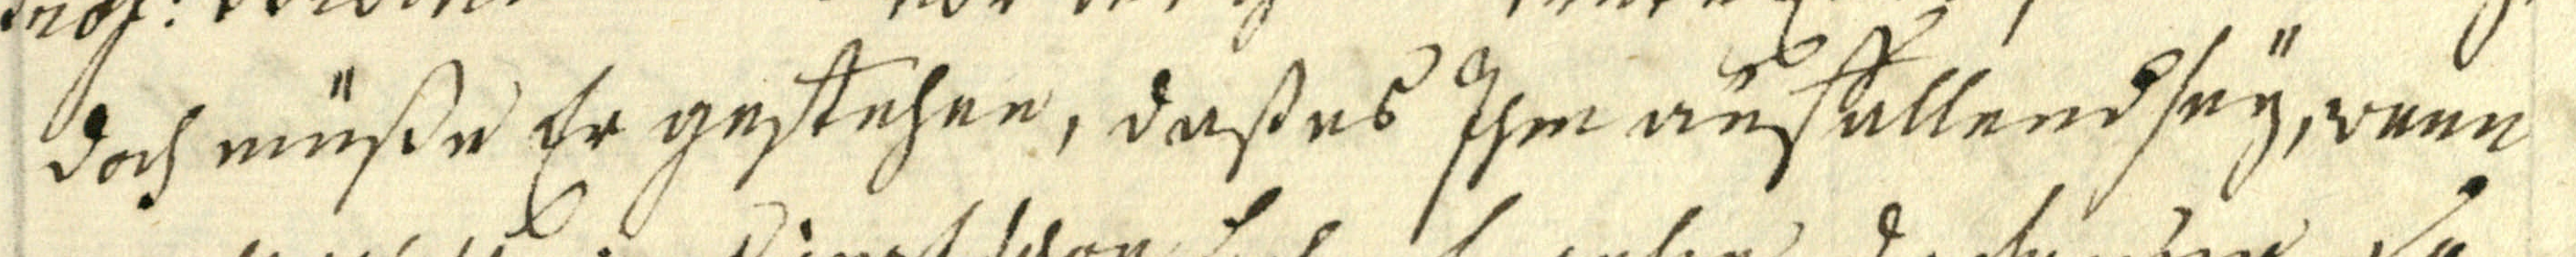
doch müße Er gestehen, daß es Ihm auffallend seÿ, wenn
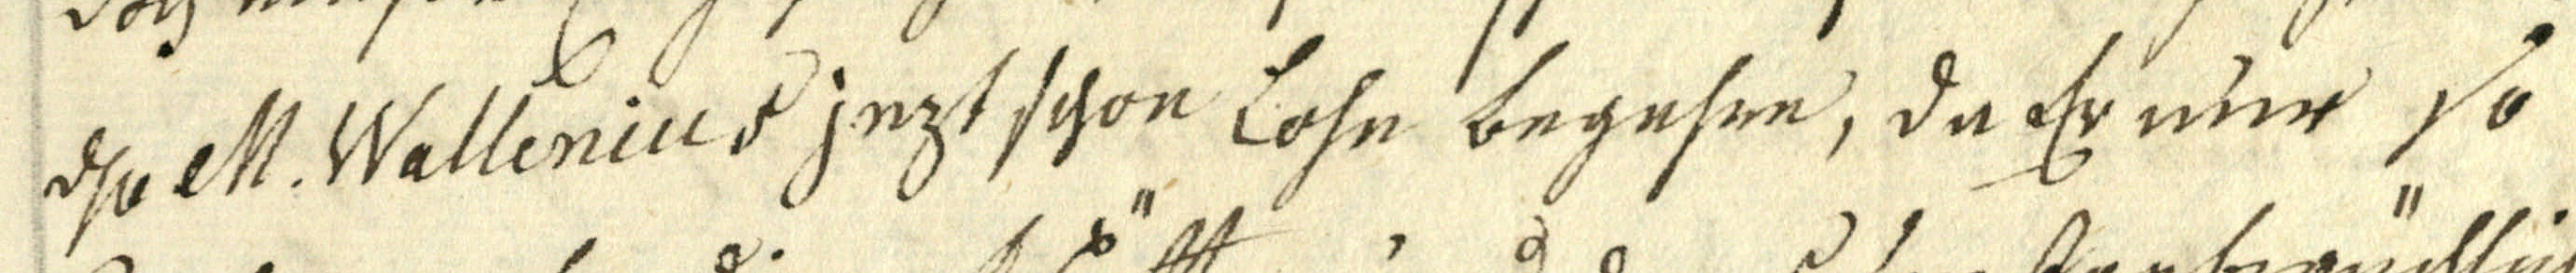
dh M Wallenius jezt schon Lohn begehre, da Er nur so
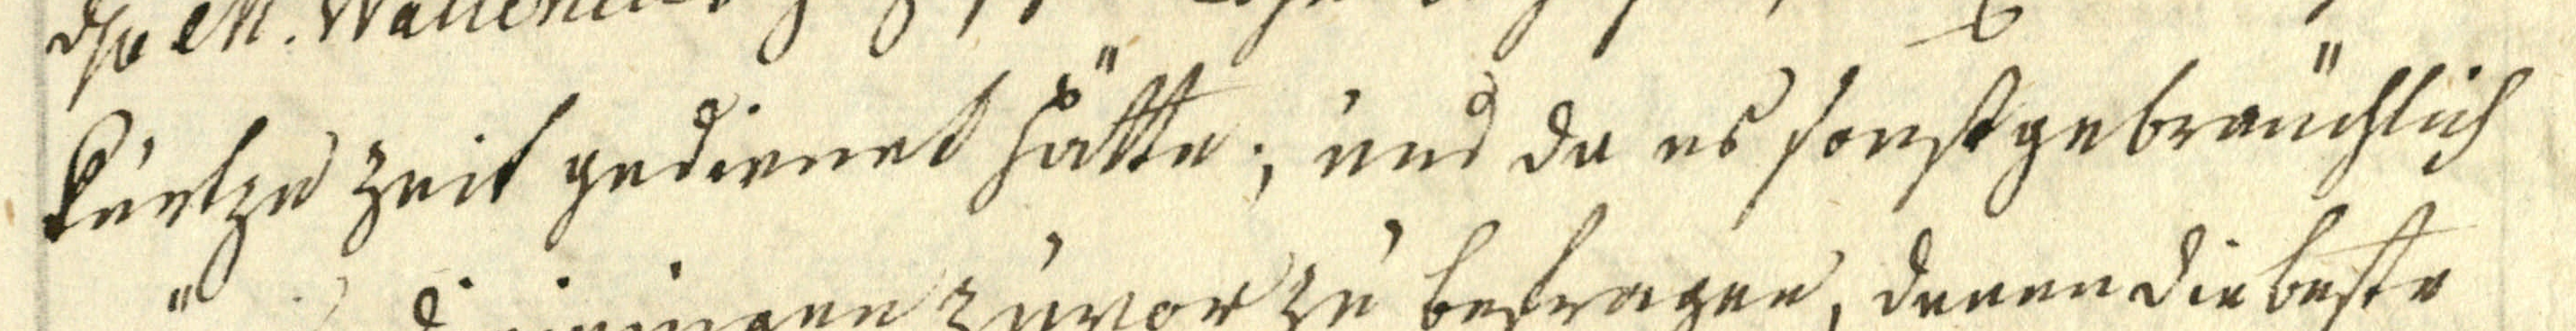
kurtze Zeit gedienet hätte; und da es sonst gebräuchlich
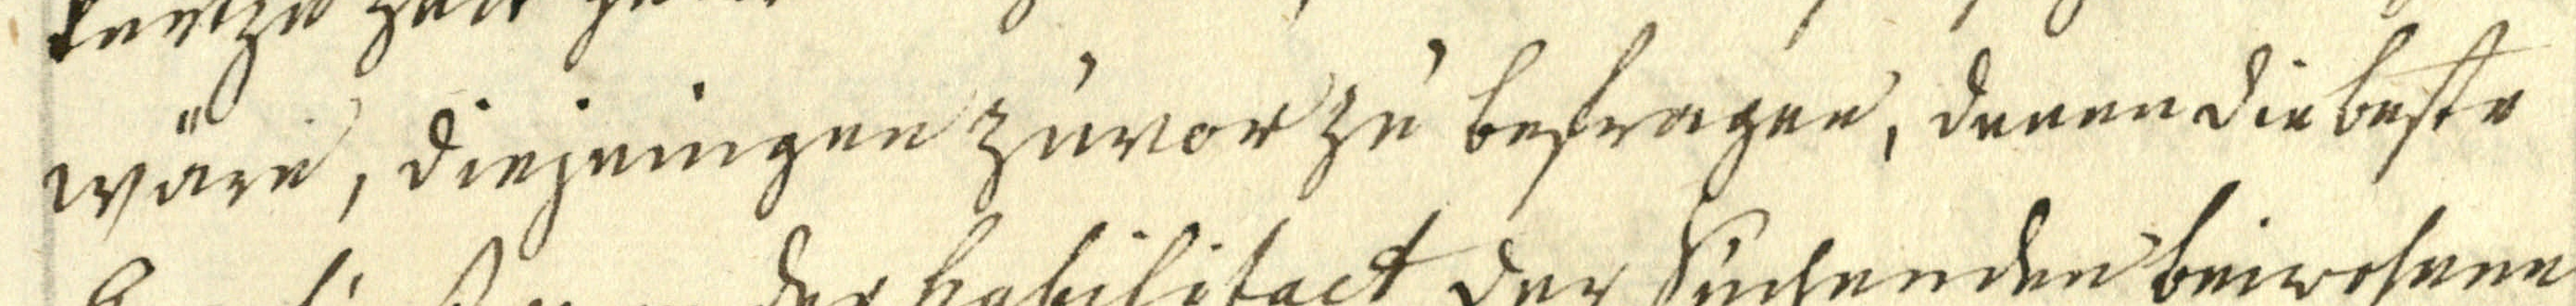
wäre, diejenigen zuvor zu befragen, denen die beste
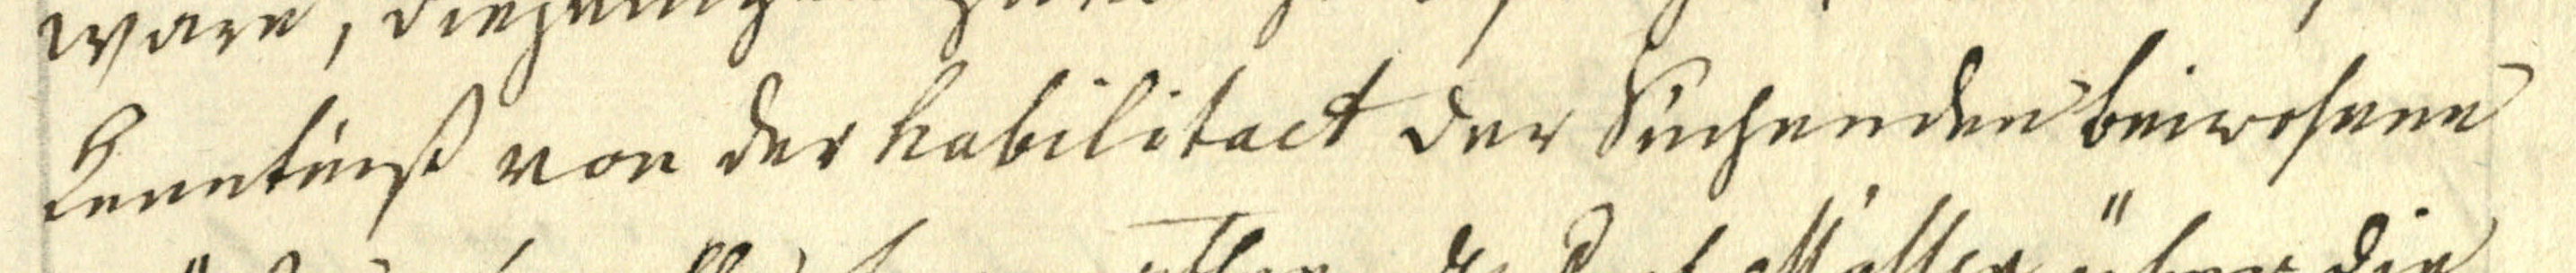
Kenntniß von der habilitaet der Suchenden beiwohnen
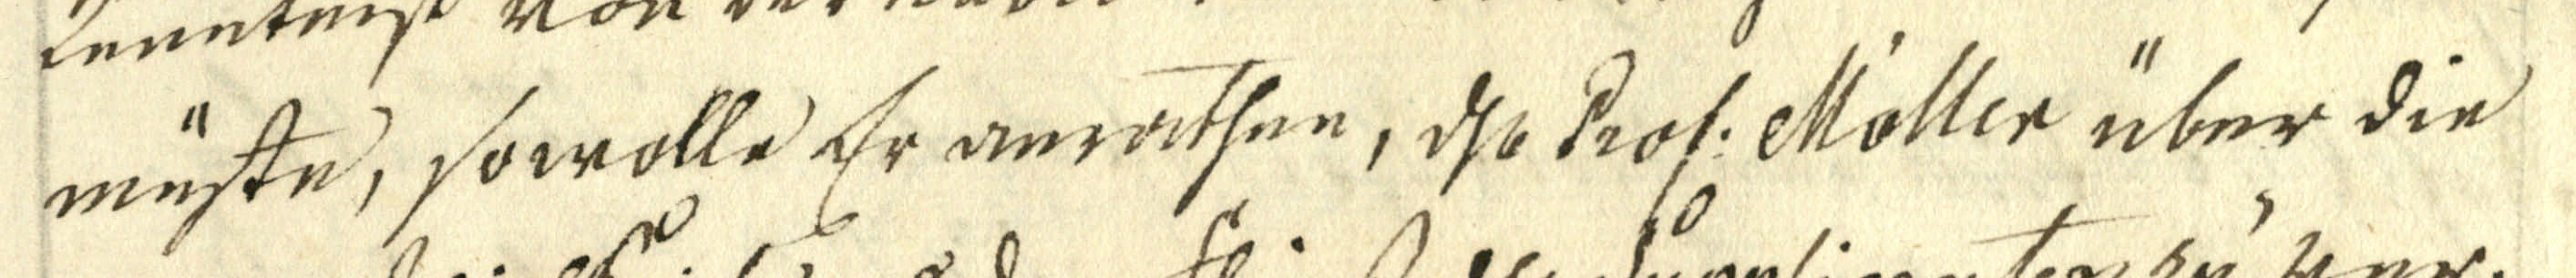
müste, so wolle Er anrathen, dh Prof. Möller über die
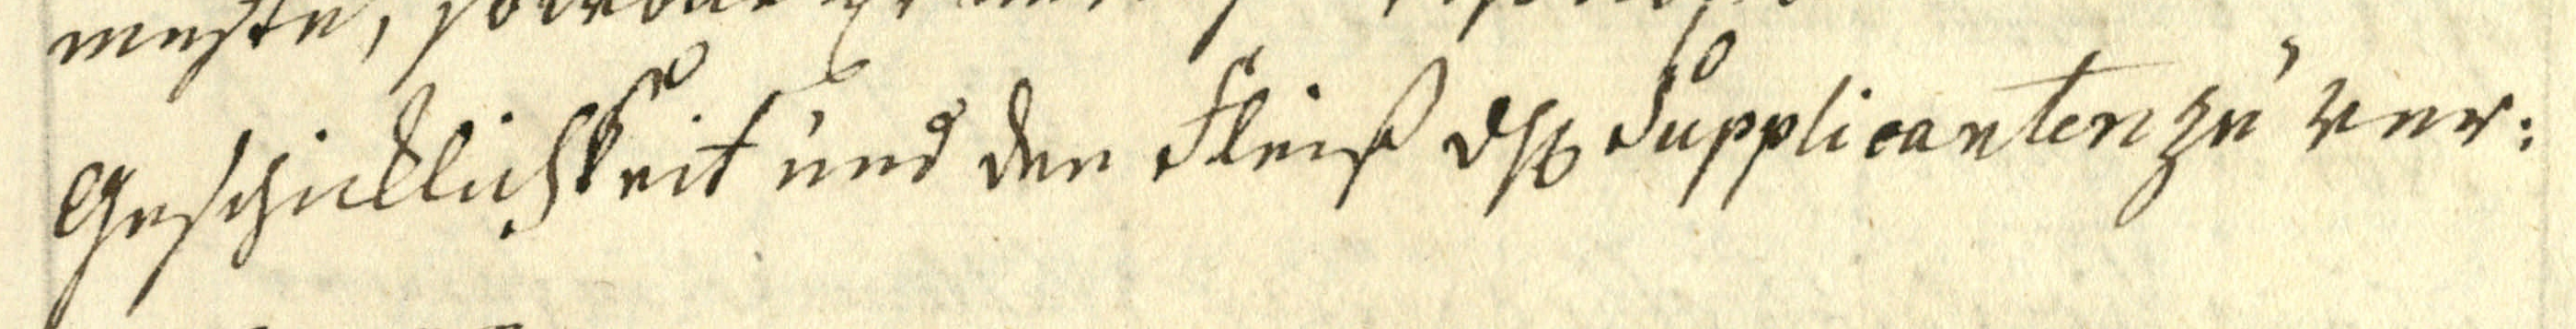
Geschicklichkeit und den Fleiß dh Supplicanten zu ver¬
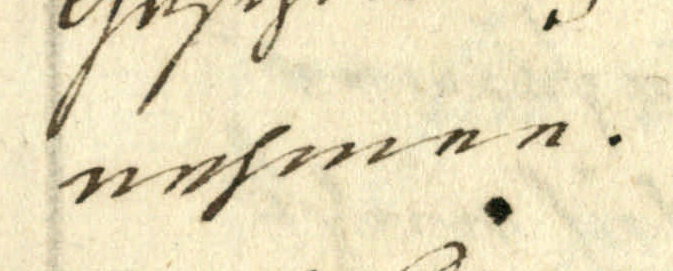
nehmen.
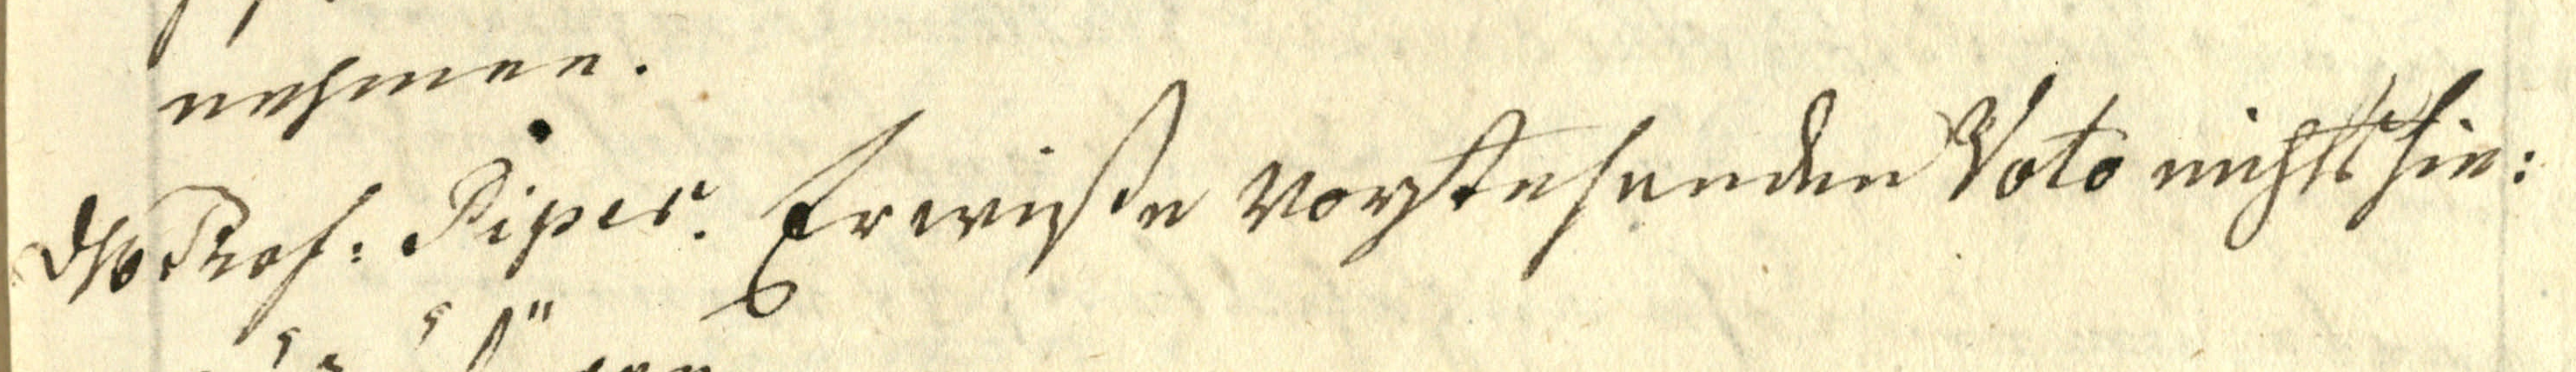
dh Prof. Piper. Er wiße vorstehendem Voto nichts hin¬
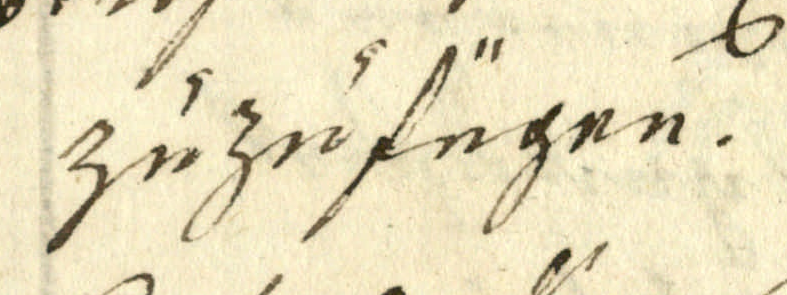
zu zufügen.
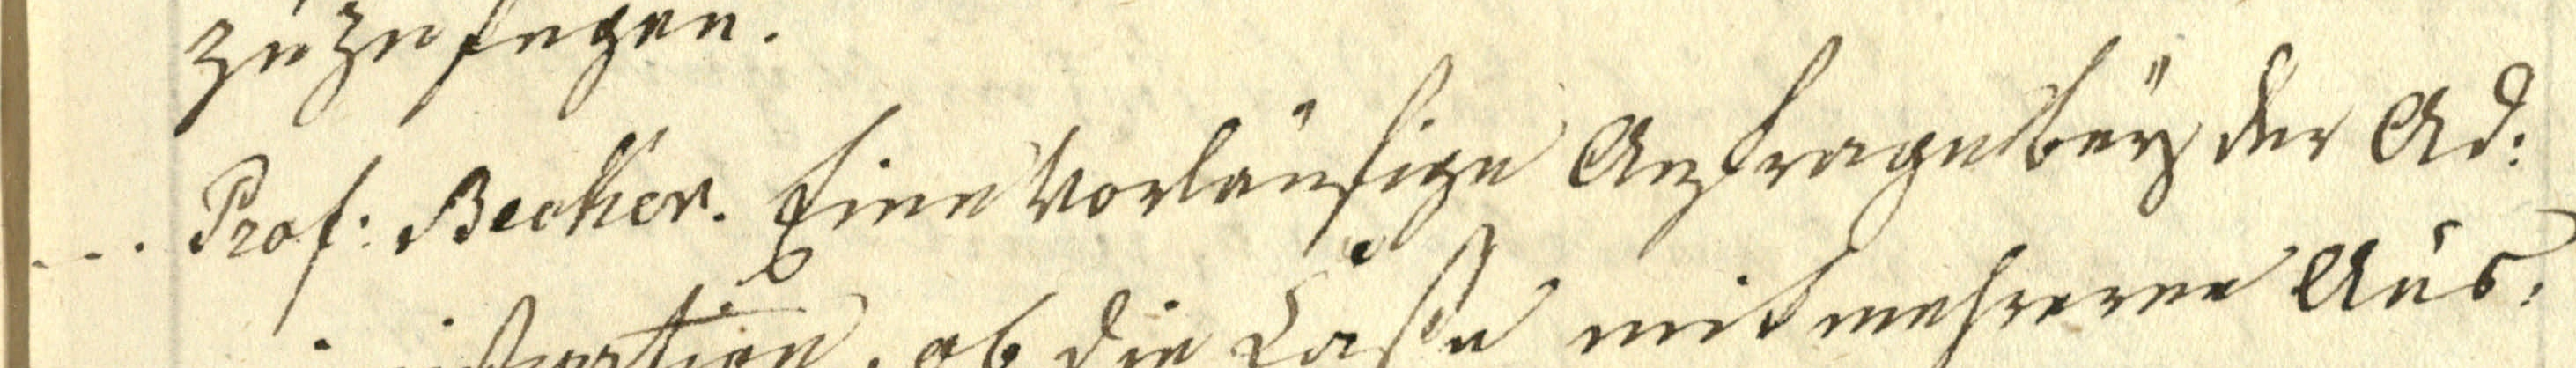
Prof. Becker. Eine vorläufige Anfrage beÿ der Ad¬
